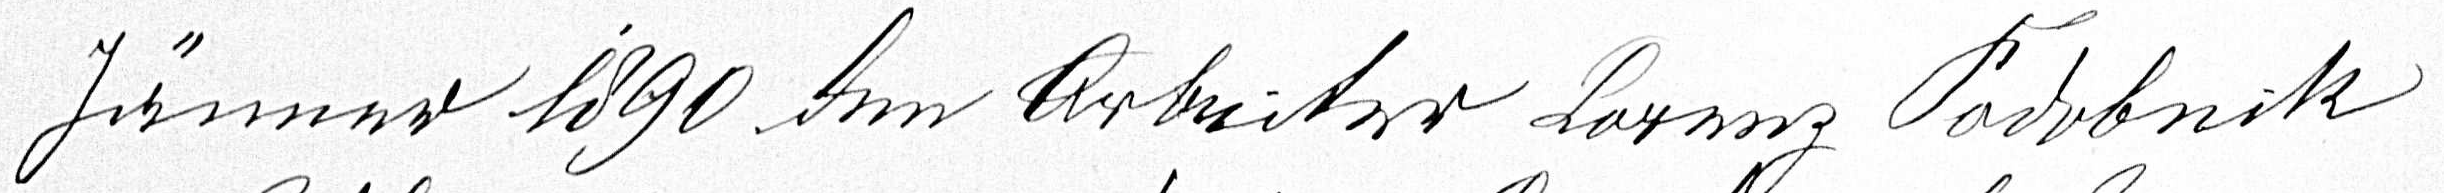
Jänner 1890 den Arbeiter Lorenz Podobnik
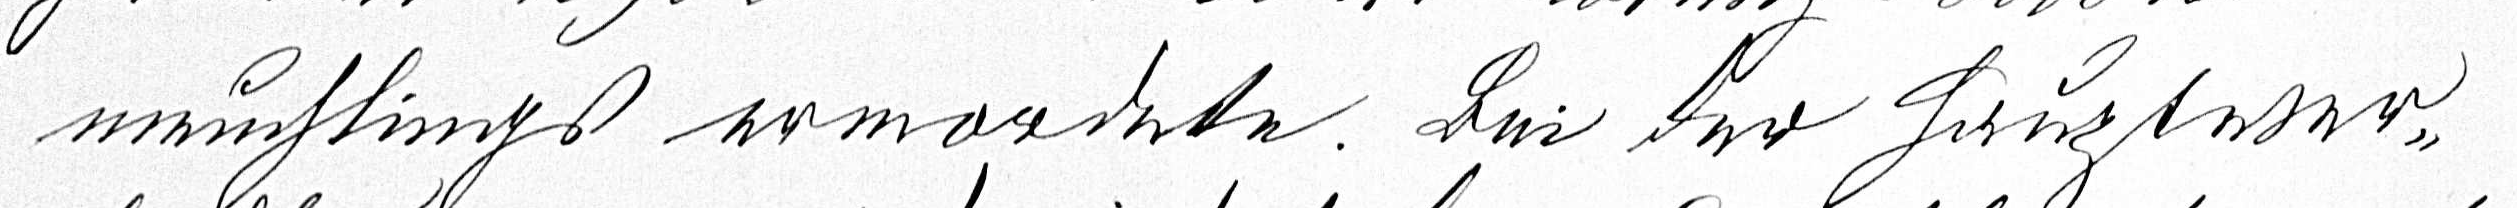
meuchlings ermordete. Bei der Hauptver¬
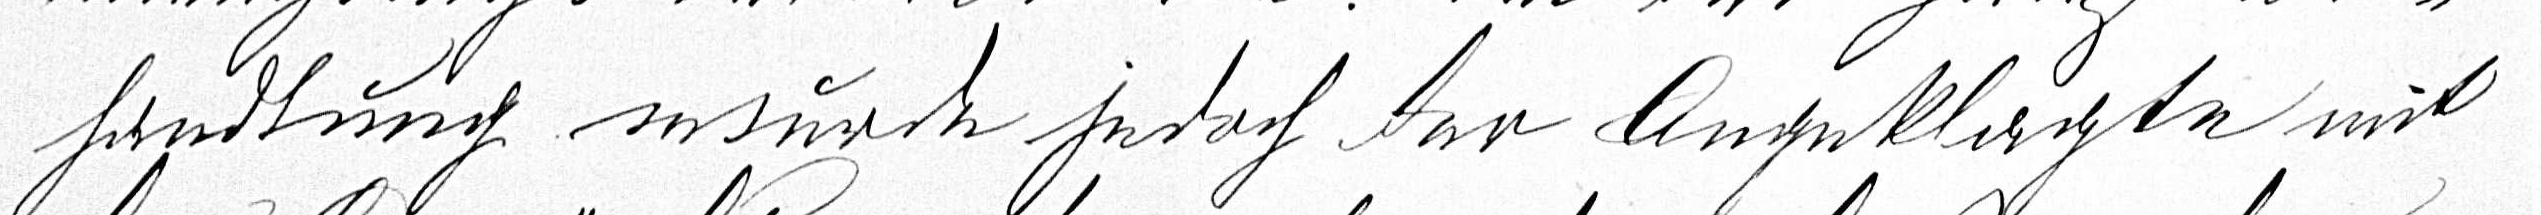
handlung wurde jedoch der Angeklagte mit
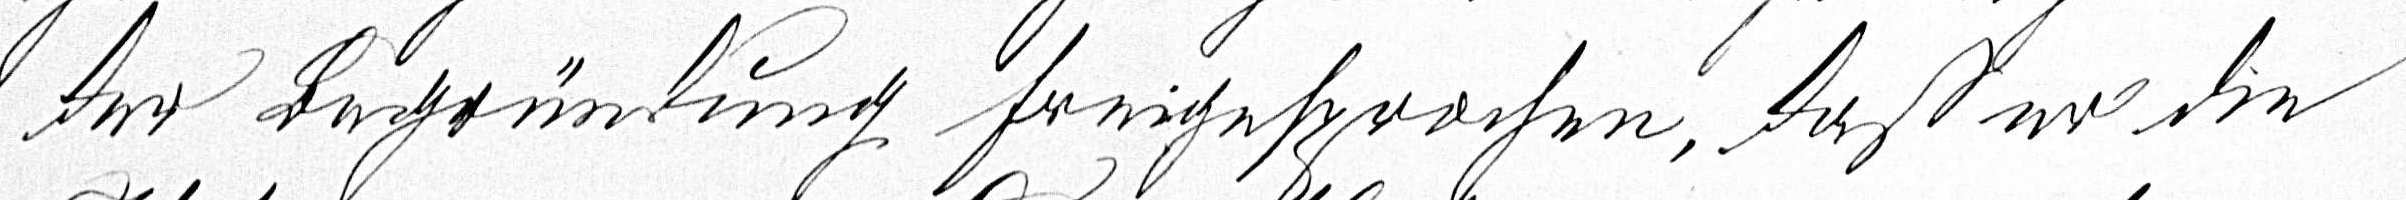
der Begründung freigesprochen, daß er die
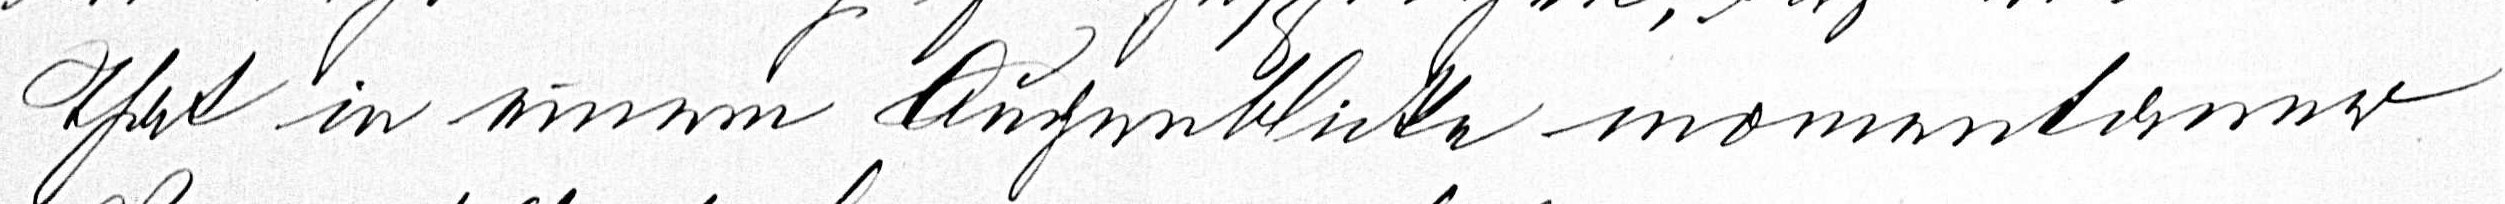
That in einem Augenblicke momentaner
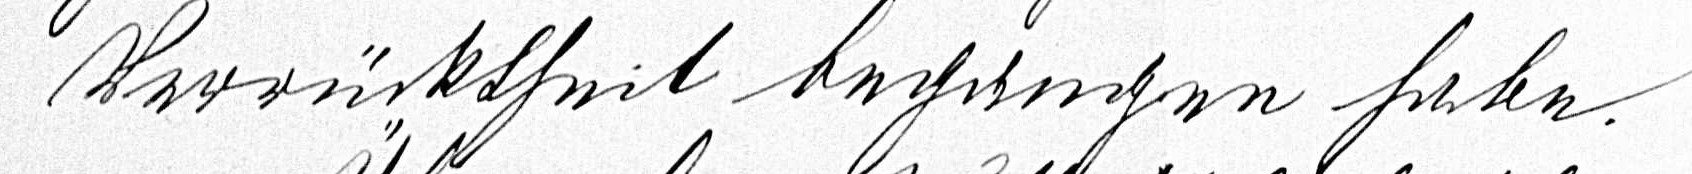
Verrücktheit begangen habe.
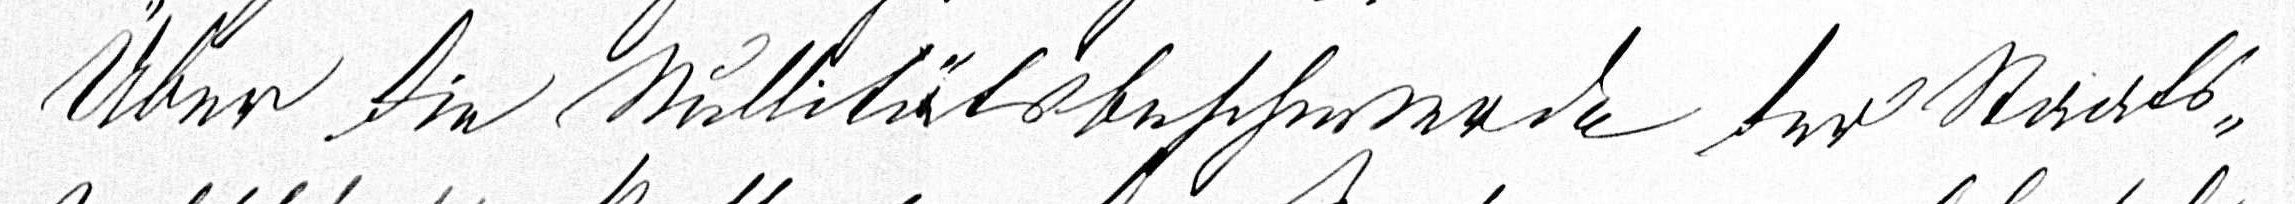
Über die Nullitätsbeschwerde der Staats¬
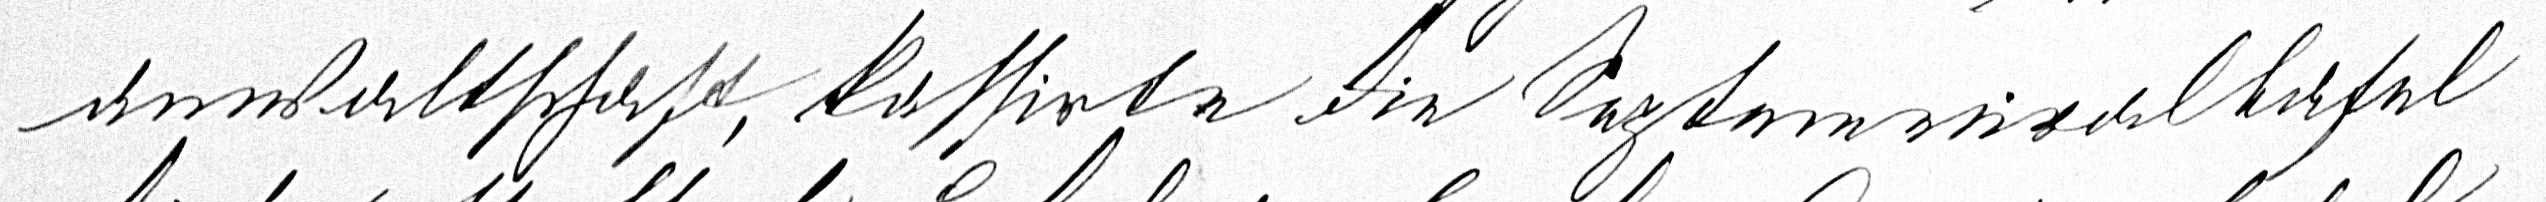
anwaltschaft, kassirte die Septemviraltafel
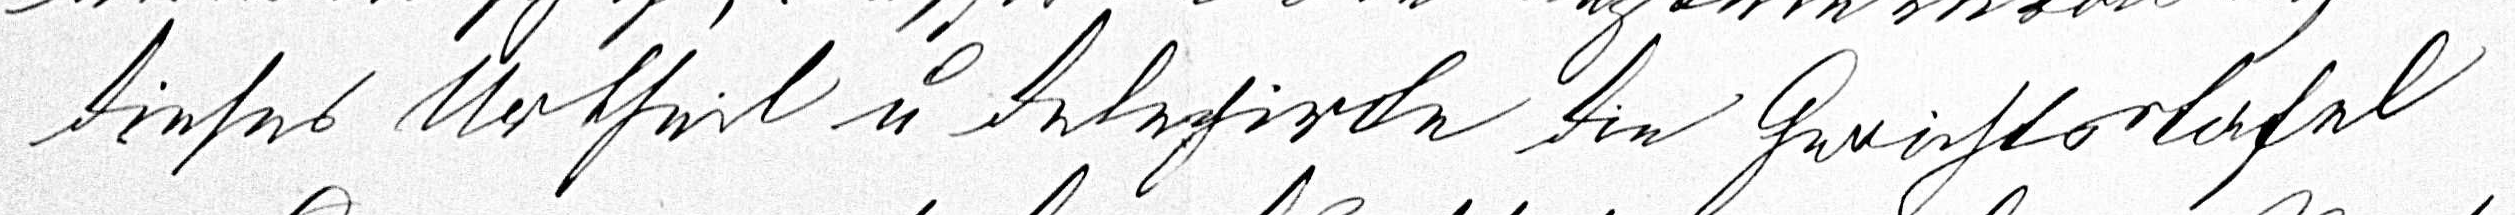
dieses Urtheil u. delegirte die Gerichtstafel
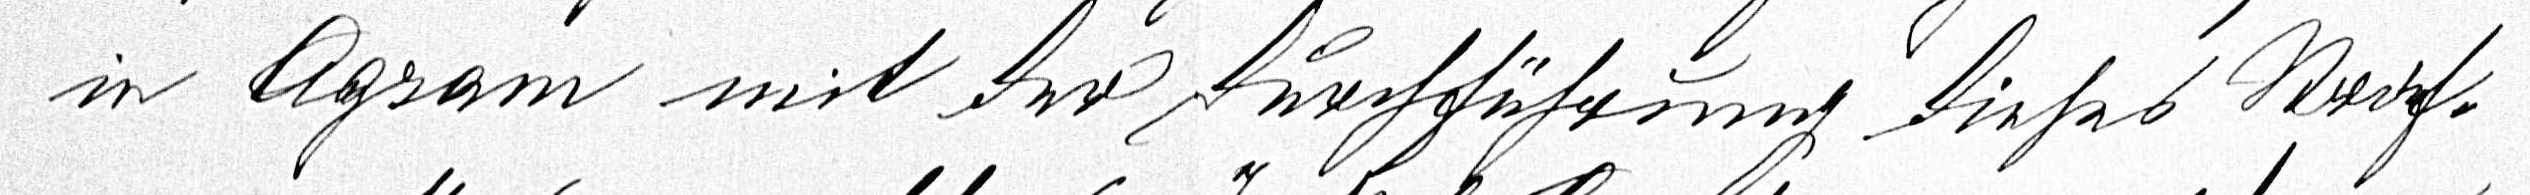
in Agram mit der Durchführung dieses Straf¬
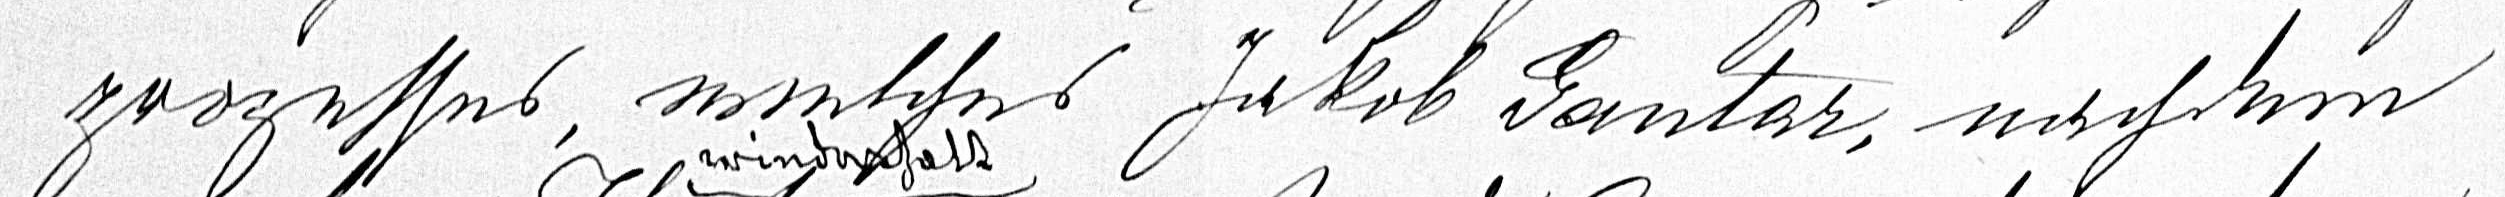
prozesses, welches Jakob Gantar, nachdem
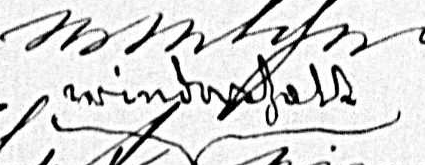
wiederholt
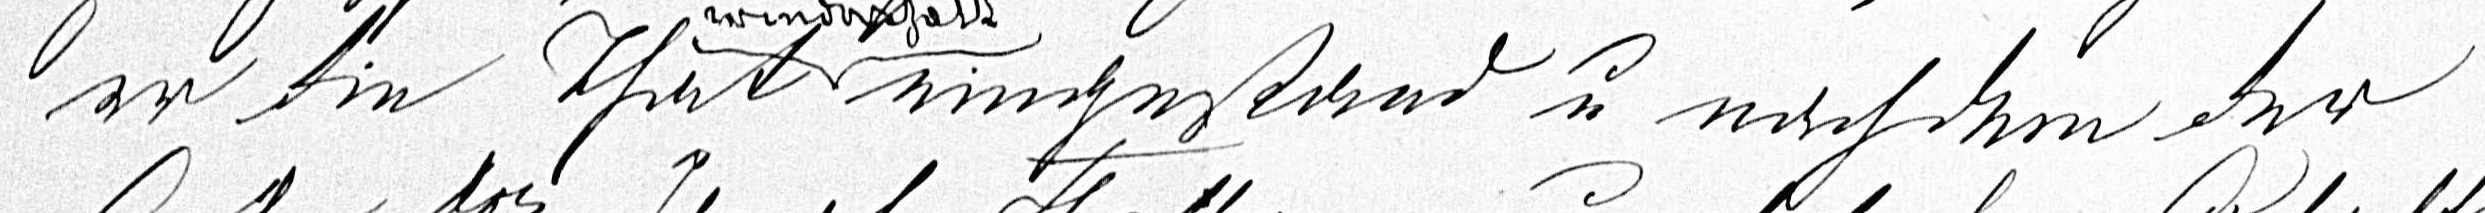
er die That eingestand u. nachdem der
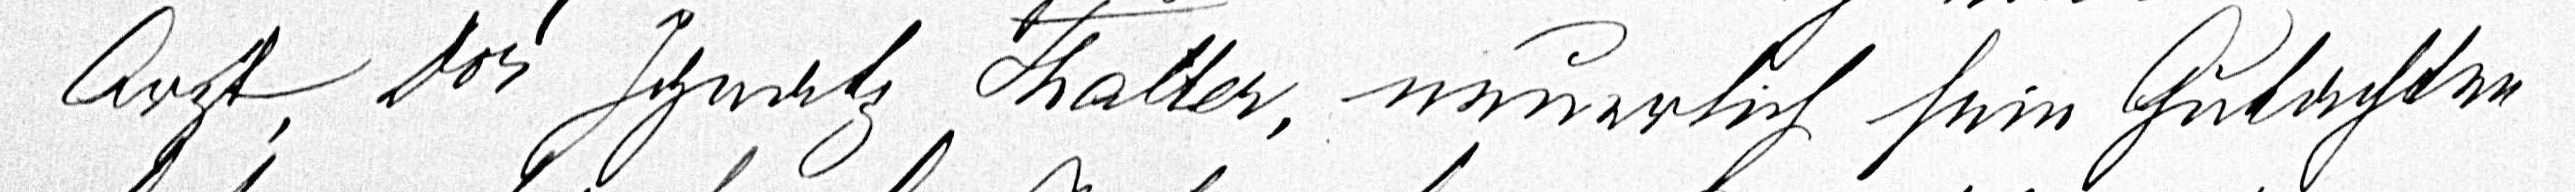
Arzt, Dr. Ignatz Thaller, neuerlich sein Gutachten
